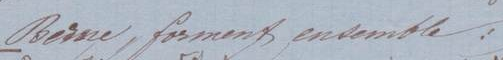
Berne, forment ensemble:
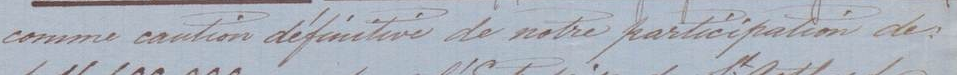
comme caution définitive de notre participation de:
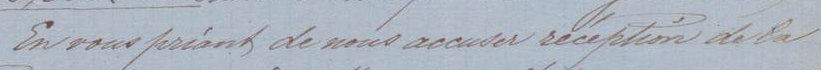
En vous priant de nous accuser réception de la
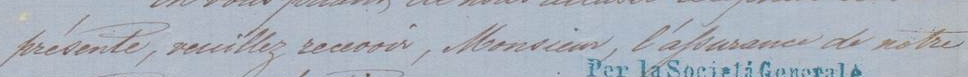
présente, veuillez recevoir, Monsieur, l'assurance de notre
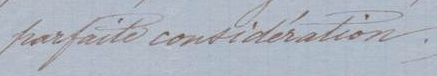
parfaite considération.
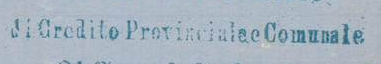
di Credito Provinciale e Comunale
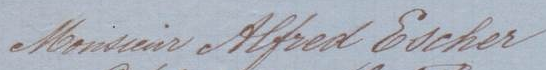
Monsieur Alfred Escher
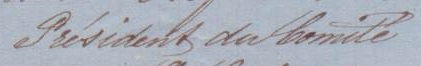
Président du Comité
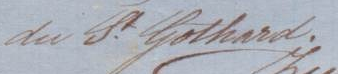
du St Gothard.
